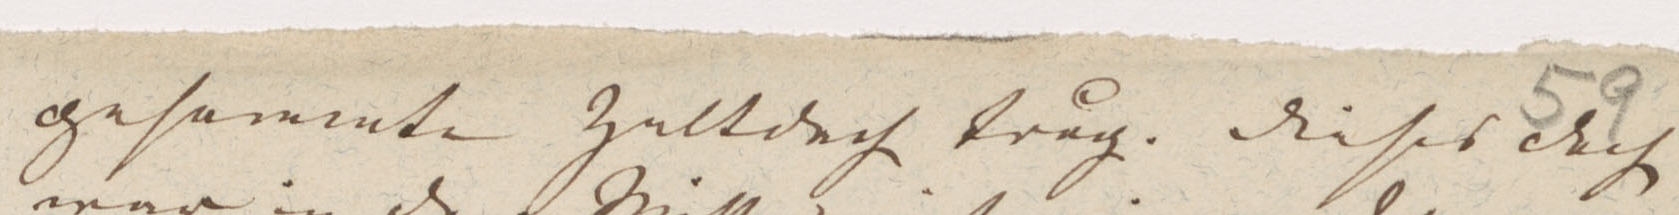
gesammte Zeltdach trug. Dieses Dach
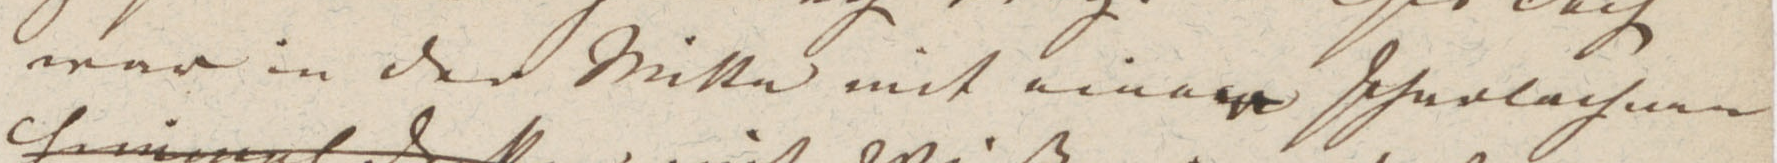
war in der Mitte mit einer scharlachnen
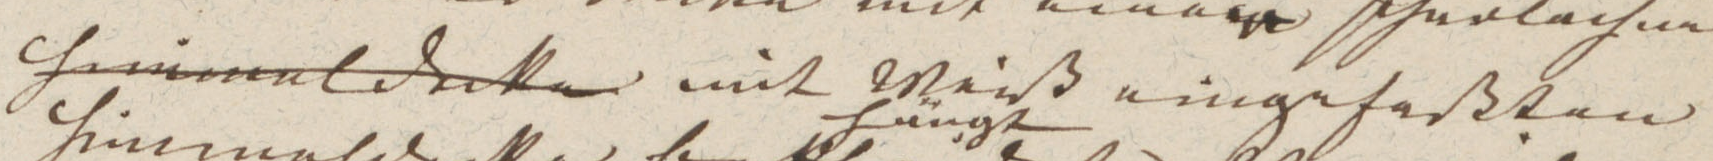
Himmeldecke mit Weiss eingefassten
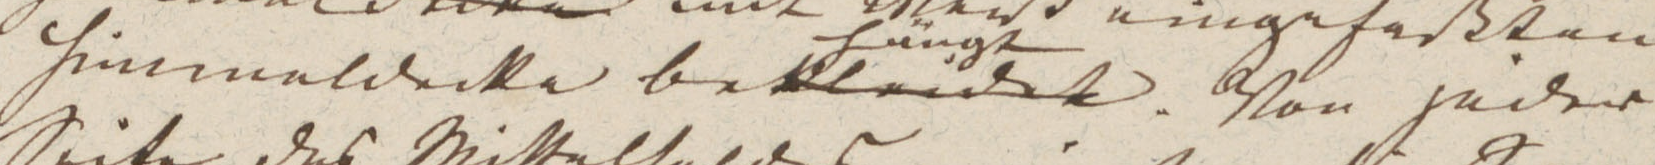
Himmeldecke bekleidethängt. Von jeder
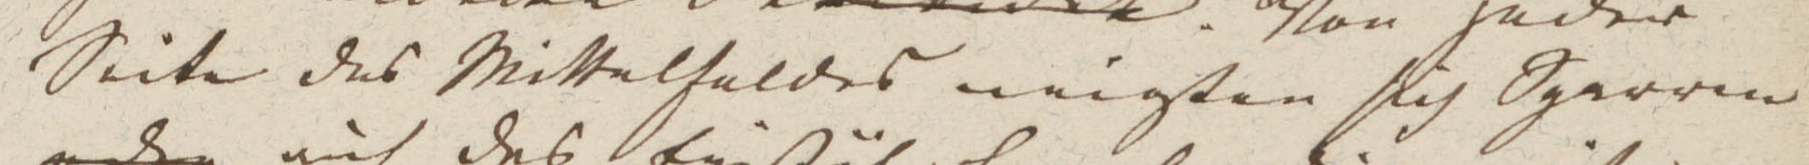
Seite des Mittelfeldes neigten sich Sparren
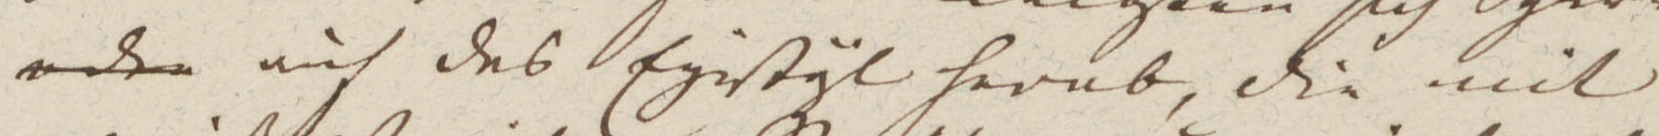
oder auf das Epistyl herab, die mit
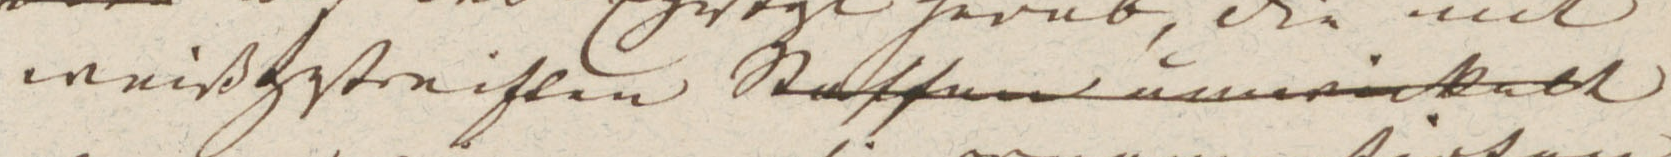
weissgestreiften Stoffen umwickelt
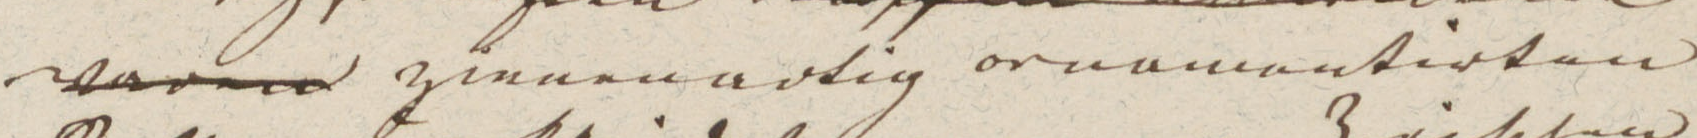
waren zinnenartig ornamentirten
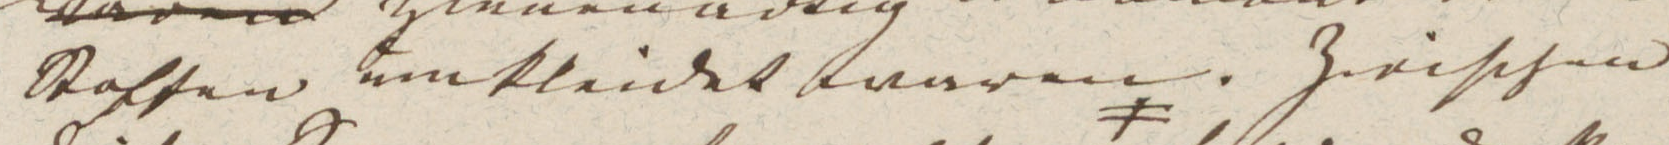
Stoffen umkleidet waren. Zwischen
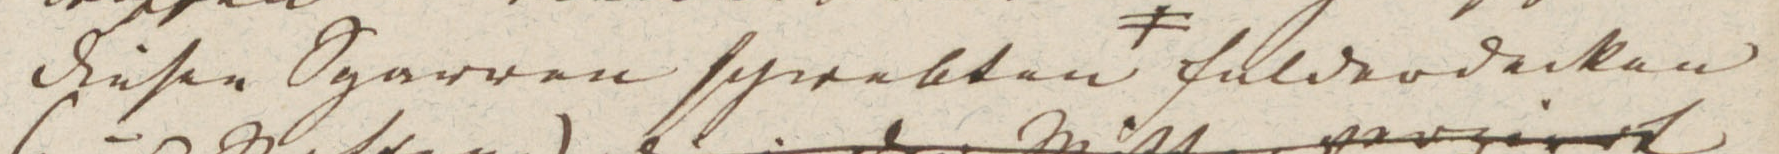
diesen Sparren schwebten % Felderdecken
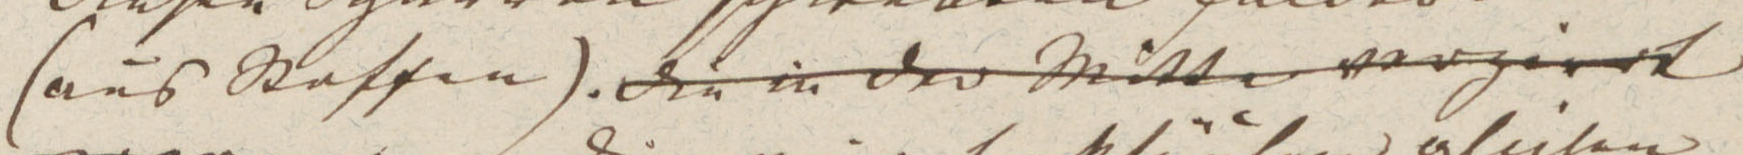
(aus Stoffen). die in der Mitte verziert
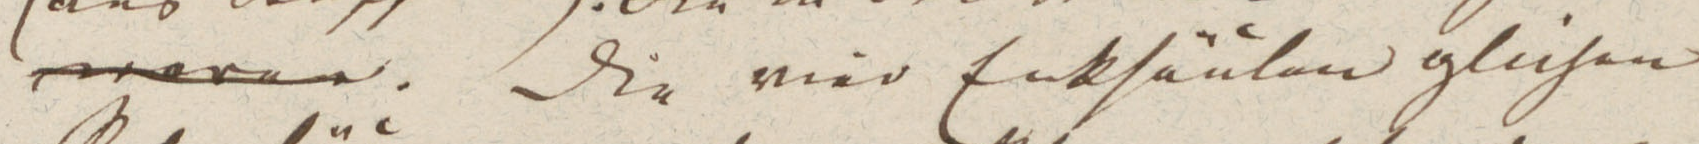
waren. Die vier Ecksäulen glichen
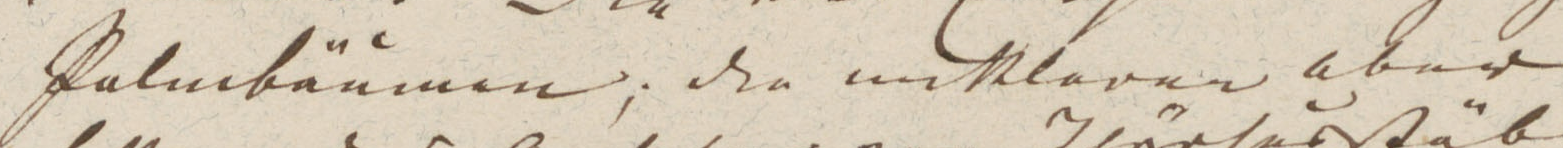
Palmbäumen; die mittleren aber
